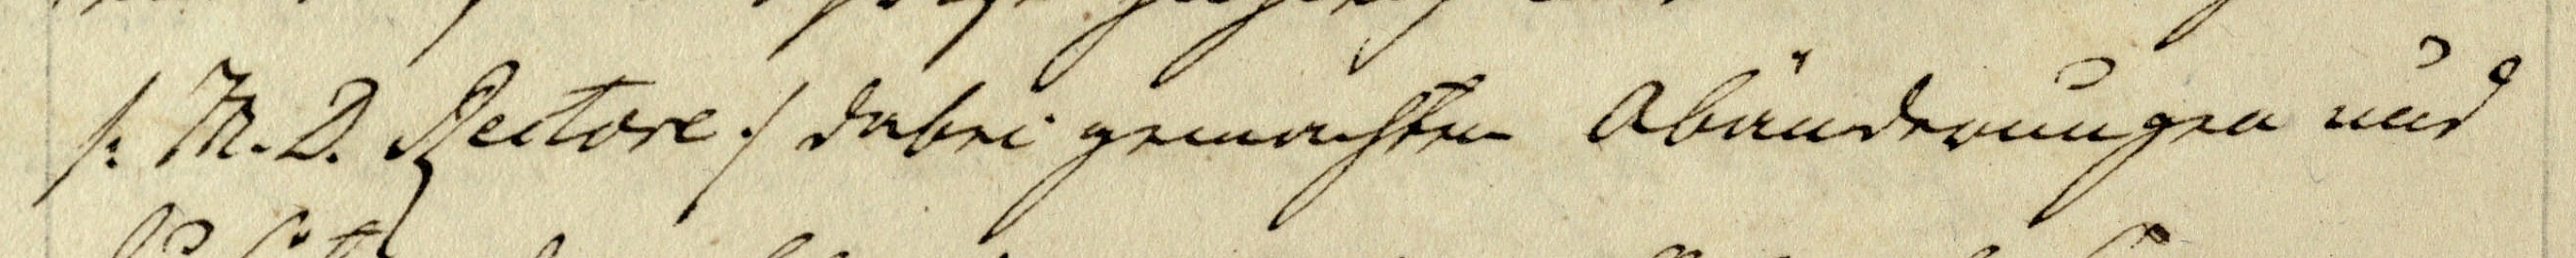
/: M. D. Rectore ./ dabei gemachten Abänderungen und
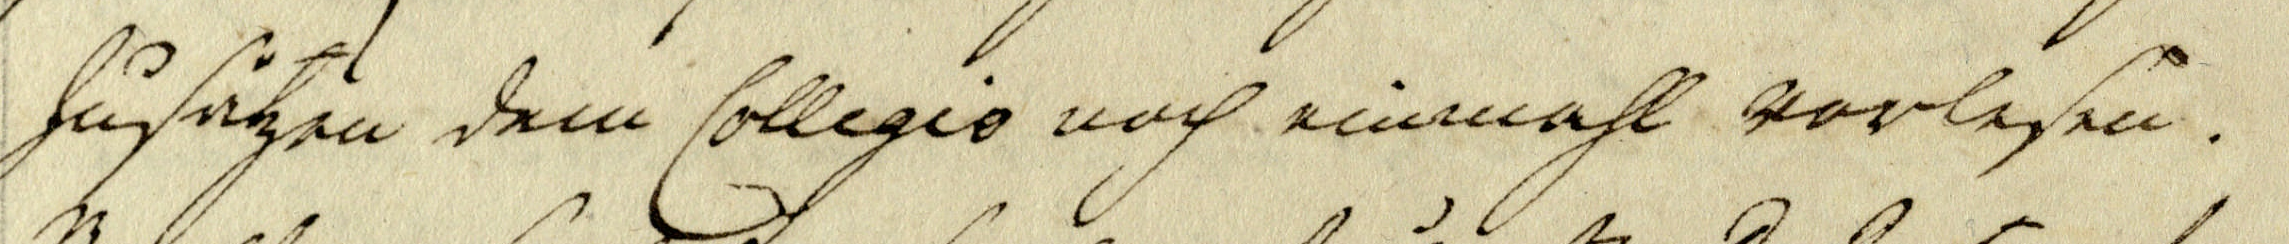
Zusätzen dem Collegio noch einmahl vorlesen.
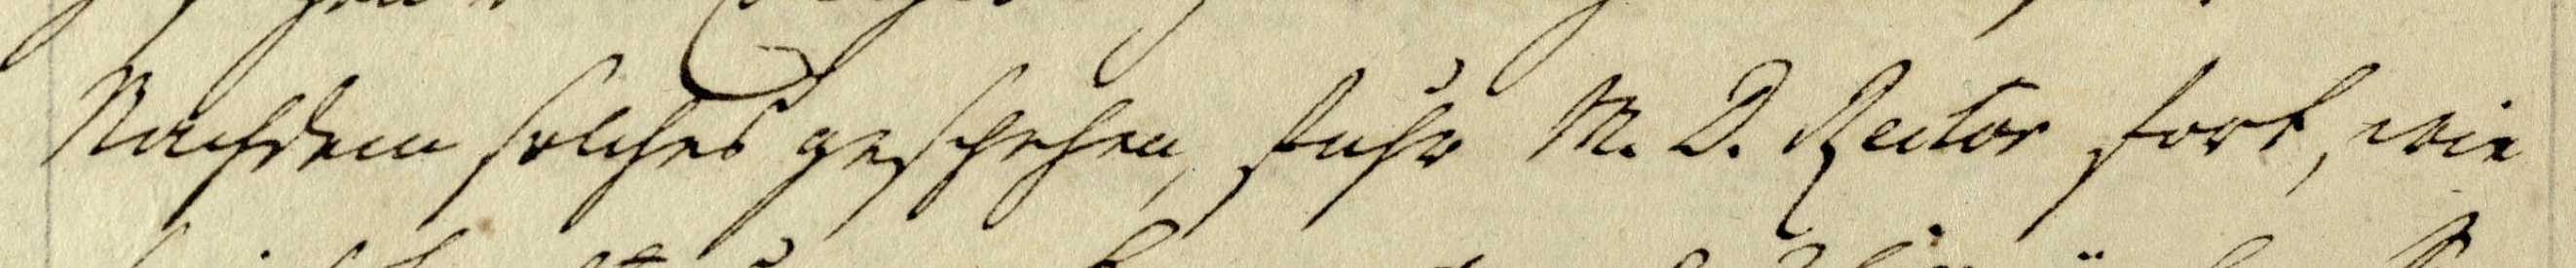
Nachdem solches geschehen, fuhr M. D. Rector fort, wie
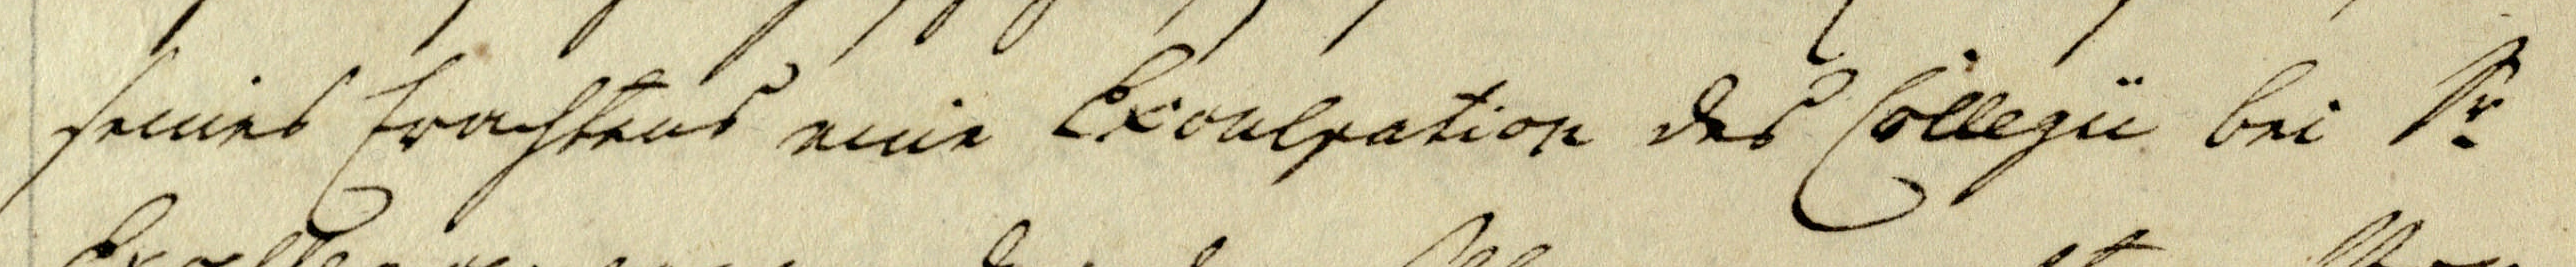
seines Erachtens eine Exculpation des Collegii bei Sr
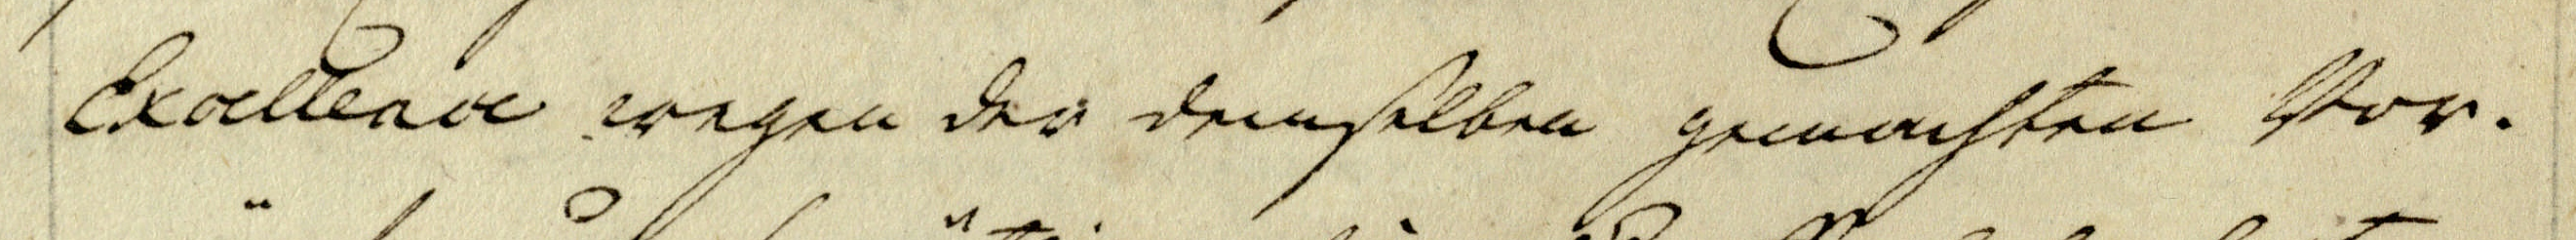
Excellence wegen der demselben gemachten Vor¬
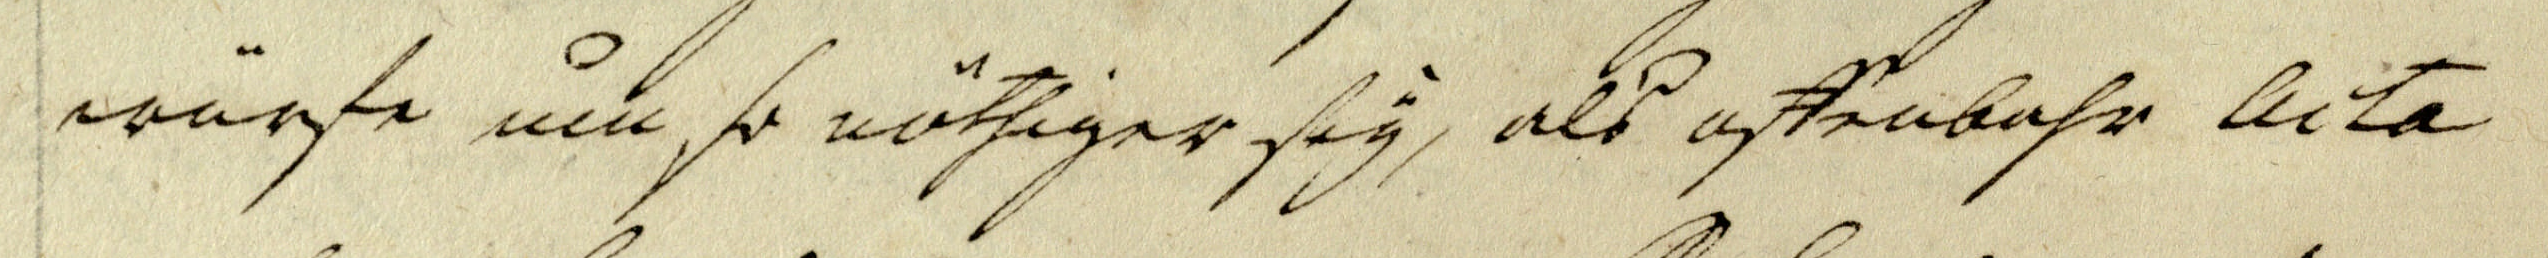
würfe um so nöthiger seÿ, als offenbahr Acta
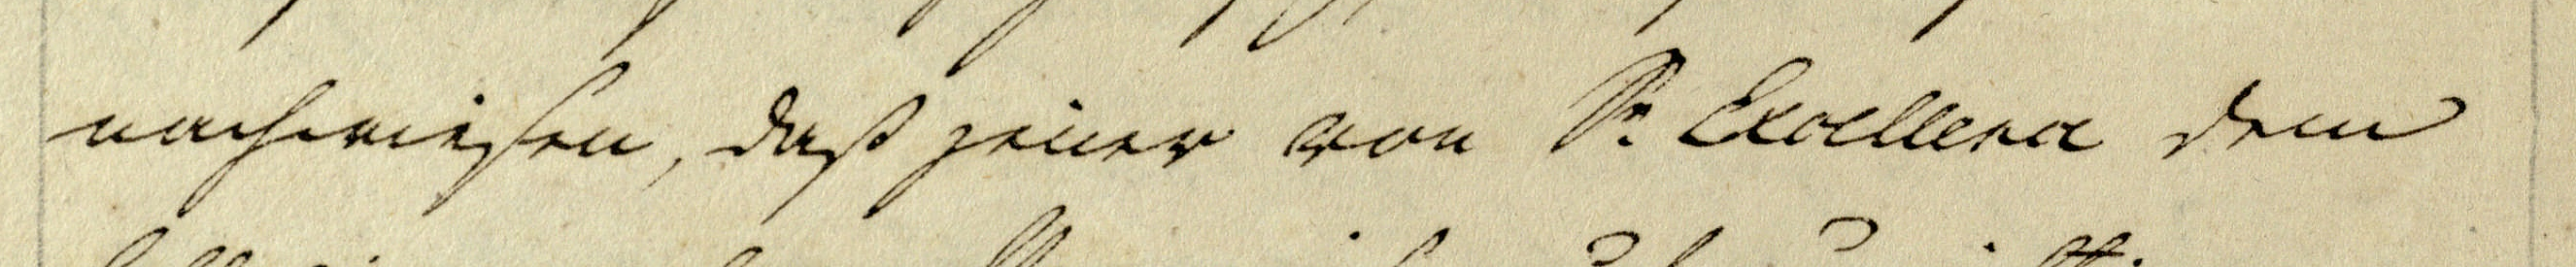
nachwiesen, daß jener von Sr Excellence dem
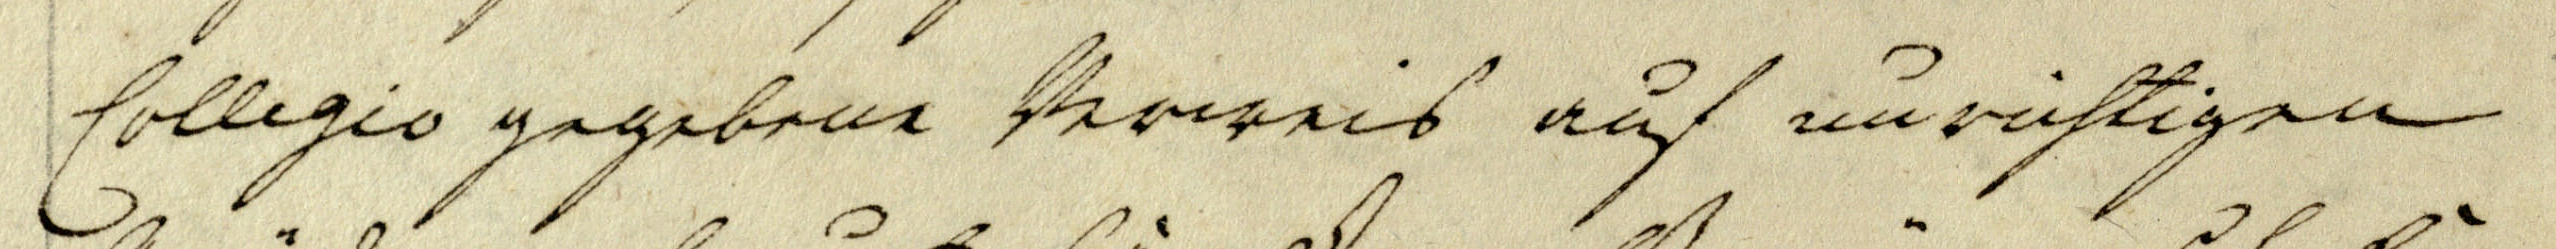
Collegio gegebene Verweis auf unrichtigen
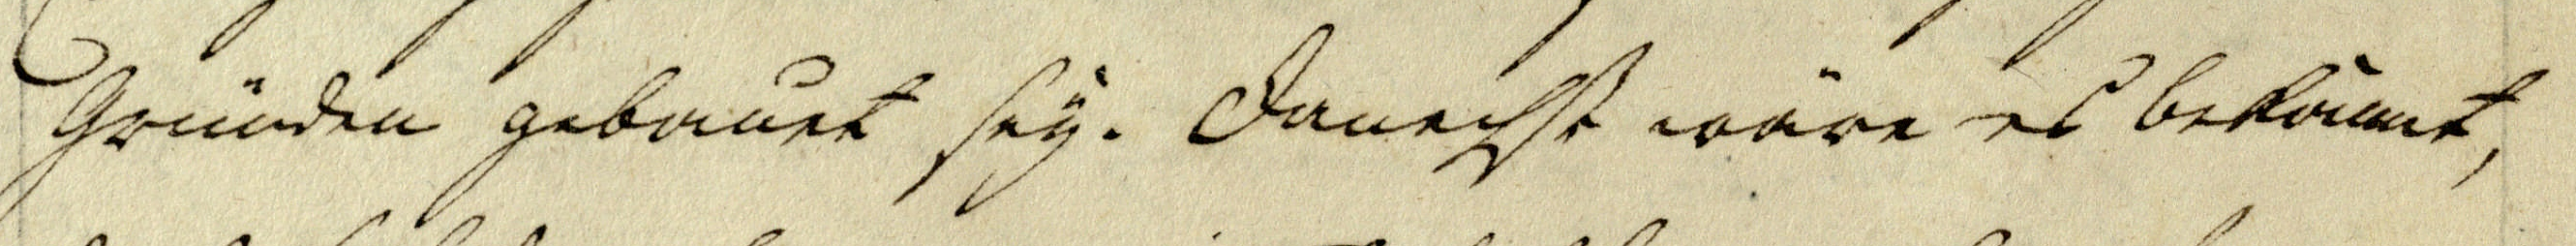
Gründen gebauet sey. Danechst wäre es bekannt,
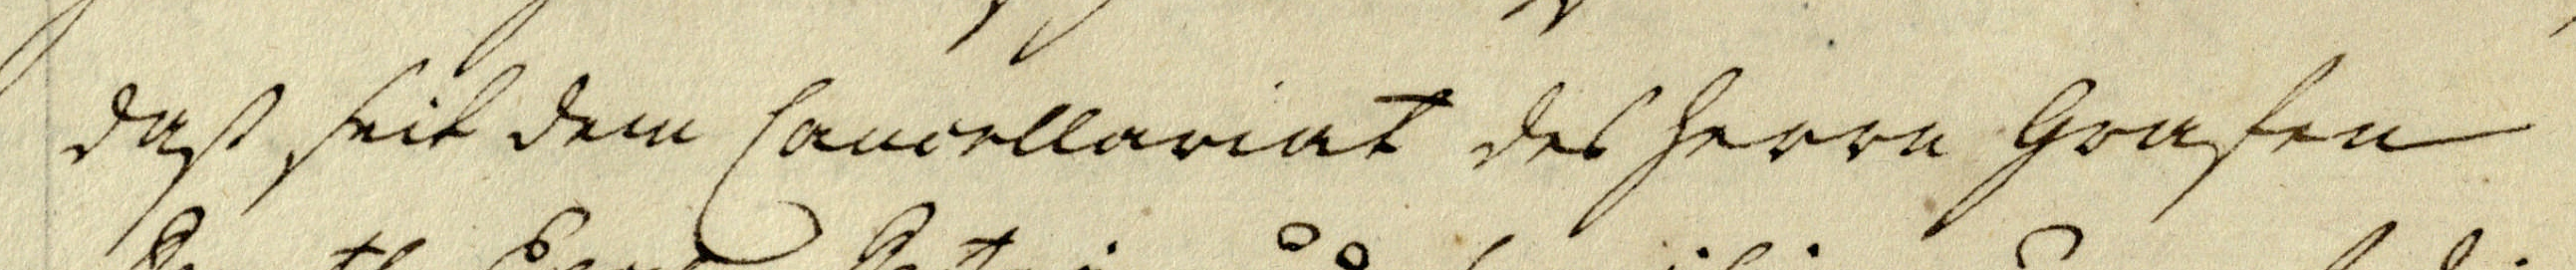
daß seit dem Cancellariat des Herrn Grafen
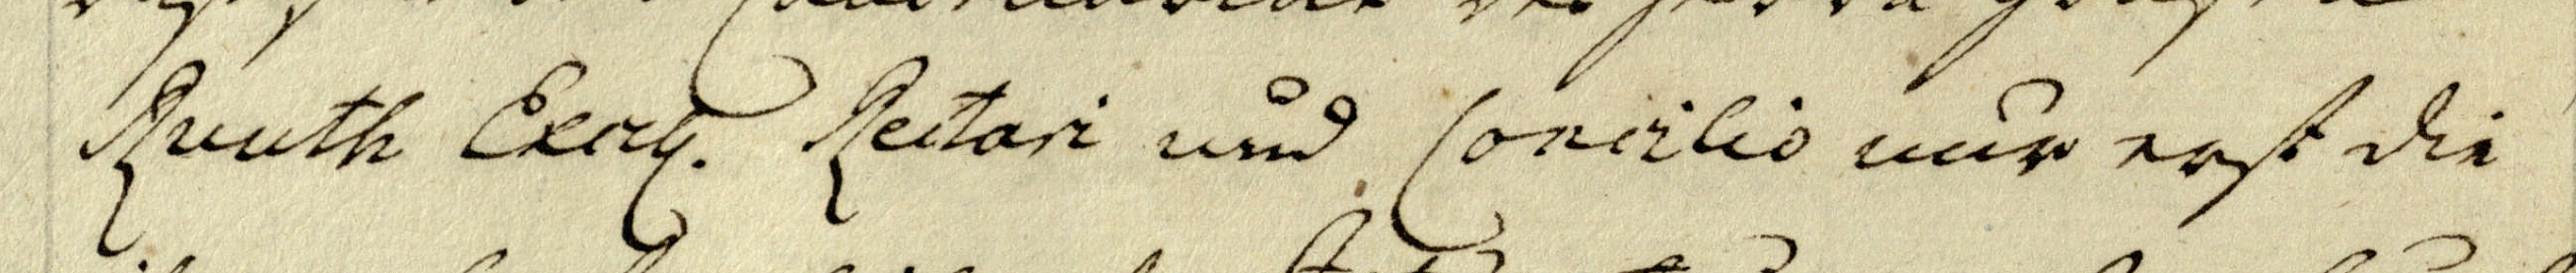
Ruuth Excell. Rectori und Concilio nur erst die
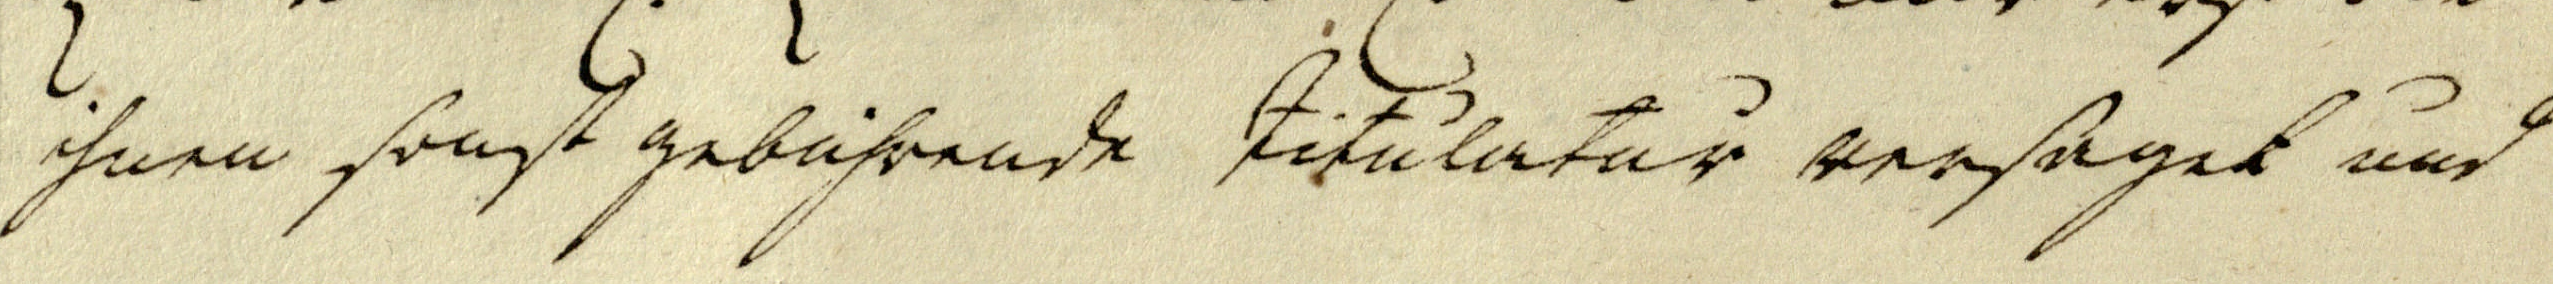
ihnen sonst gebührende Titulatur versaget und
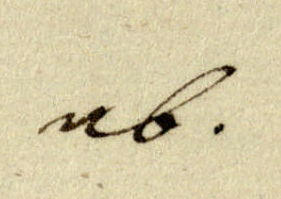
ab¬
